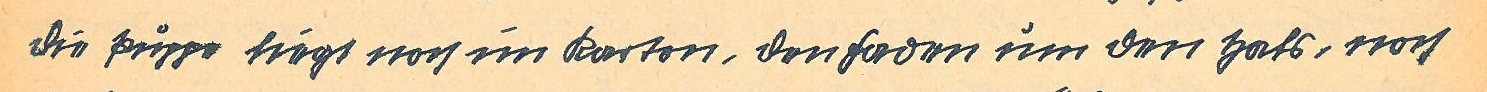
die Puppe liegt noch im Karton, den Faden um den Hals, noch
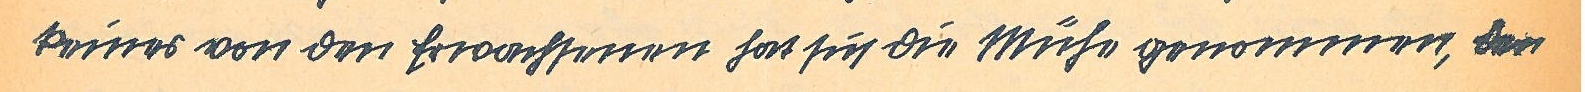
keines von den Erwachsenen hat sich die Mühe genommen, den
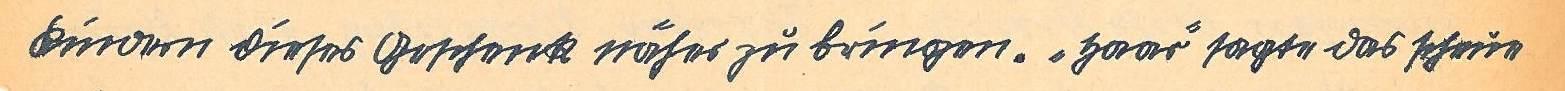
Kindern diese Geschenke näher zu bringen. „Haar“ sagte das scheue
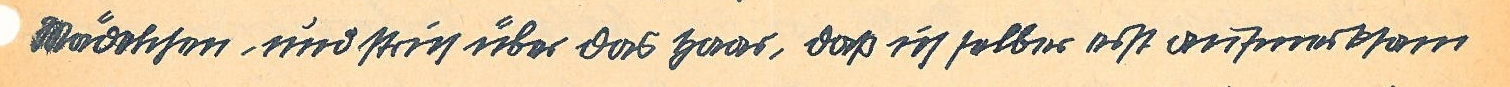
Mädchen, und strich über das Haar, daß ich selber erst aufmerksam
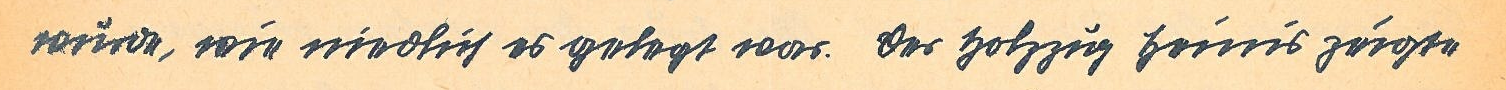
wurde, wie niedlich es gelegt war. Der Holzzug Heinis zeigte
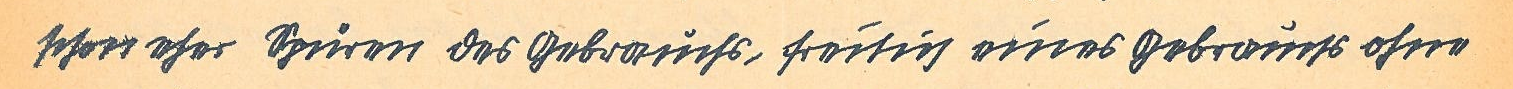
schon eher Spuren des Gebrauchs, freilich eines Gebrauchs ohne
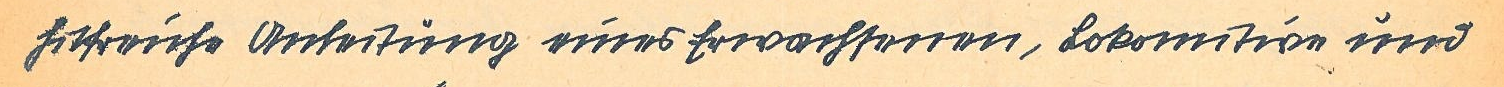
hilfreiche Anleitung eines Erwachsenen, Lokomotive und
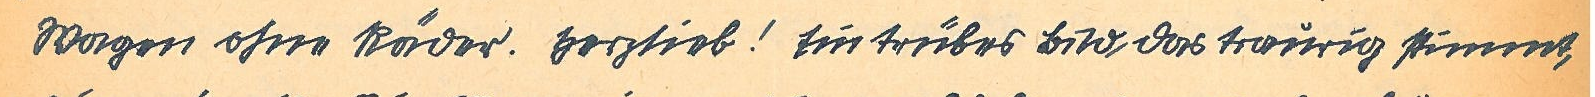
Wagen ohne Räder. Herzlieb! Ein trübes Bild, das traurig stimmt,
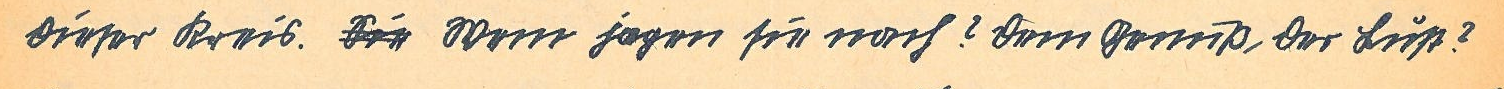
dieser Kreis. Sie Wem jagen sie nach? Dem Genuß, der Lust?
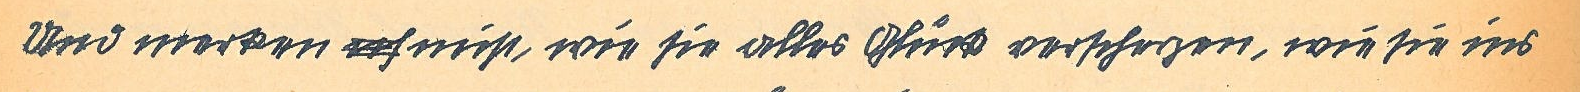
Und merken ich nicht, wie sie alles Glück verscherzen, wie sie ins
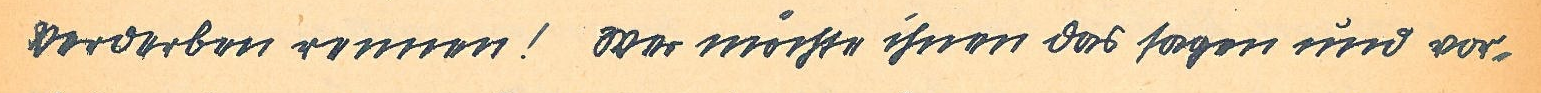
Verderben rennen! Wer möchte ihnen das sagen und vor¬
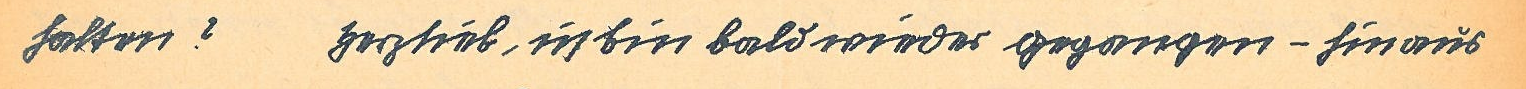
halten? Herzlieb, ich bin bald wieder gegangen – hinaus
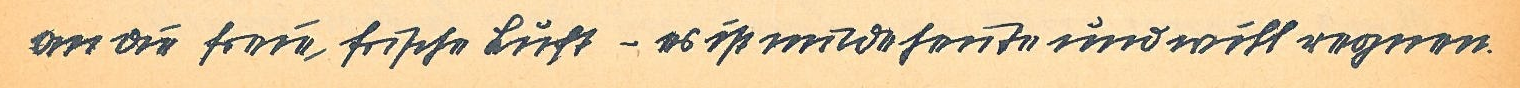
an die freie, frische Luft – es ist milde heute und will regnen.
